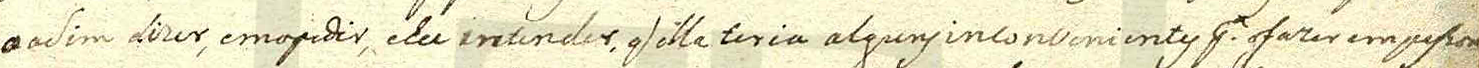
o aSim dizer, e mo pedir, e Eu intender, q̄ ella teria alguns inconvenientes p.a o fazer em pessoa
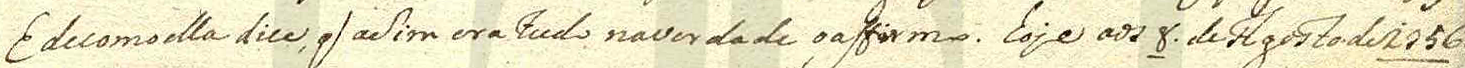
E de como ella dice, q̄ aSim era tudo na verdade o affirmo. hoje aos 8. de Agosto de i756.
